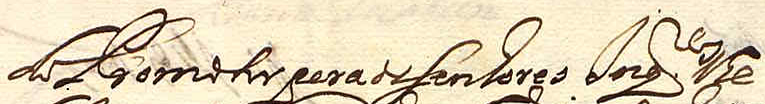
do Promotor pera os senhores Inq̄.res lhe
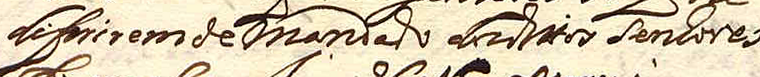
diferirem de mandado dos dittos senhores
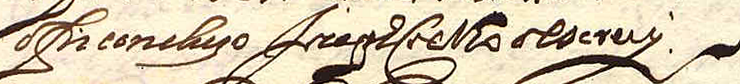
o fiz concluzo Jozeph Coelho o escreuy.
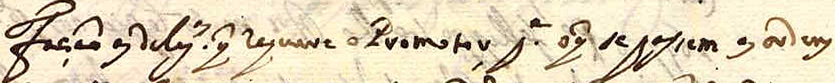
Fação as delig.as q̄ requere o Promotor, p.a o q̄ se passem as ordens
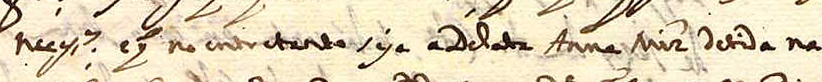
necessas.; e q̄ no entretanto seja a Delata Anna Miz̄ detida na
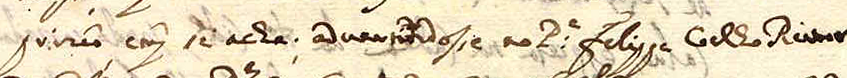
prizão em q̄ se acha: advertindosse ao P.e Felippe Coelho Reitor
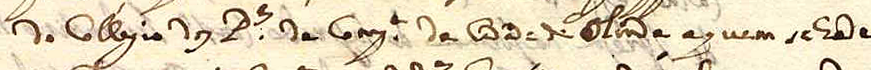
do Collegio dos P.es de Comp.a da Cidade de Olinda a quem se ha de
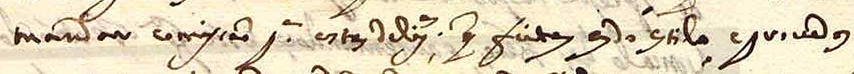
mandar comissaõ p.a estas deligas.; q̄ feitas as do estilo e priuados
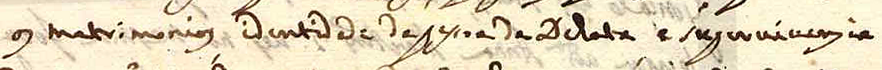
os matrimonios identidade da pessoa da Delata, e superuiuensia
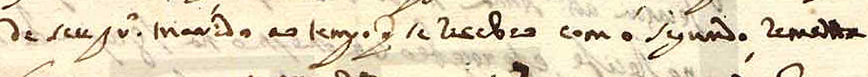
de seu pro. marido ao tempo q̄ se recebeo com o segundo, Remetta
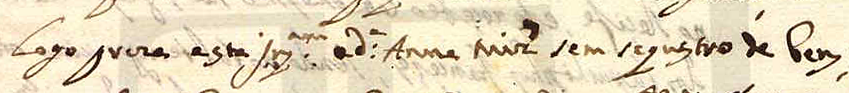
Logo preza esta Jnq.am a da. Anna miz̄ sem sequestro de bens;
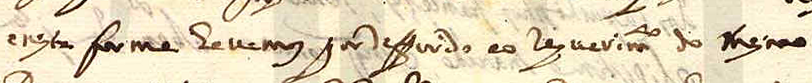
e nesta forma hauemos por defferido ao Requerimto do Mesmo
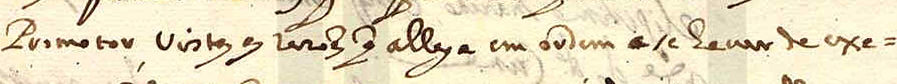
Promotor, vistas as rezoẽs q̄ allega em ordem a se hauer de exe
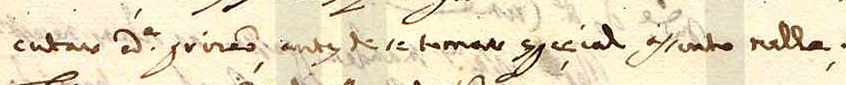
cutar a d.a prizão, antes de se tomar speçial assento nella;
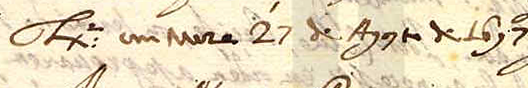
Lx.a em meza 27 de Agosto de 1697.
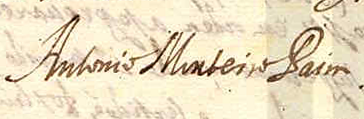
Antonio Monteiro Paim
